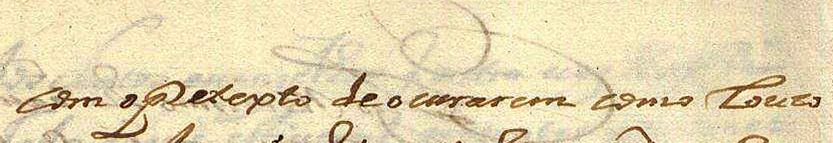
com o pretexto de o curarem como louco
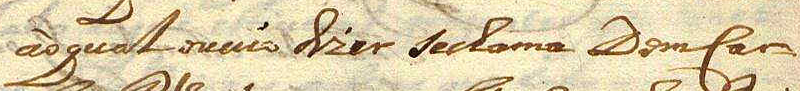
ao qual ouuio dizer se chama Dom Car
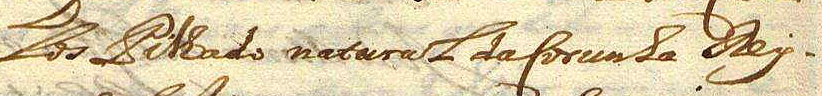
Los Pilhado natural da Corunha Rey
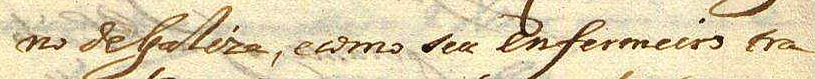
no de Galiza, e como seu enfermeiro tra
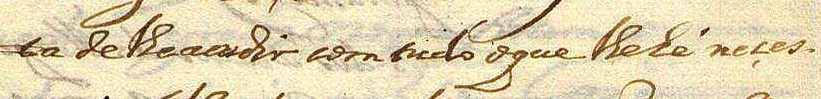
ta de lhe acudir com tudo o que lhe hé neces
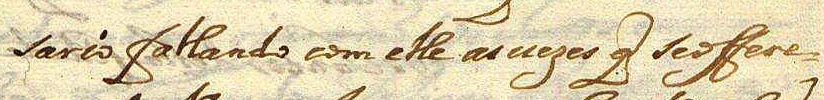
sario fallando com elle as uezes q̄ se offere
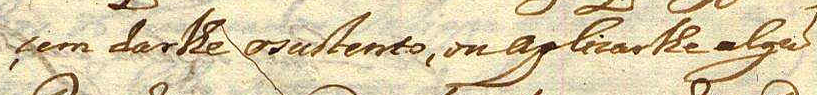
cem darlhe o sustento, ou aplicarlhe algū
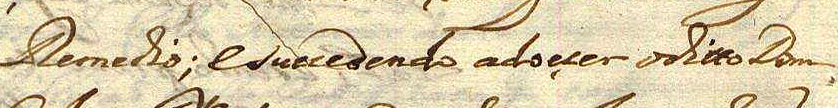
Remedio; e succedendo adoecer o ditto Dom
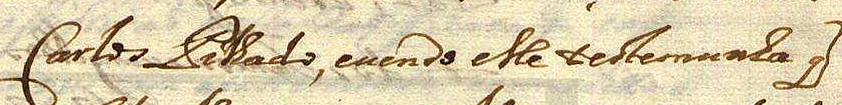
Carlos Pilhado, e uendo elle testemunha q̄
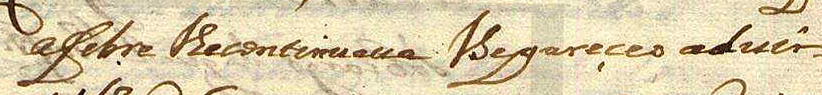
a febre lhe continuaua lhe pareceo aduir
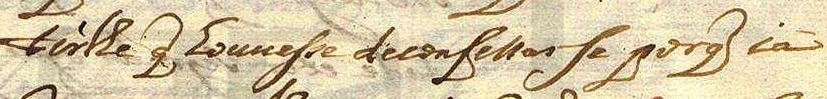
tirlhe q̄ houuesse de confessarse porq̄ iá
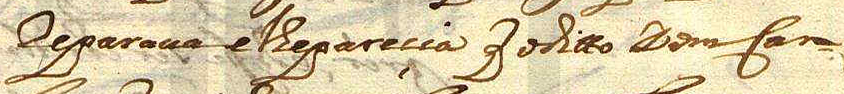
Reparaua e lhe parecia q̄ o ditto Dom Car
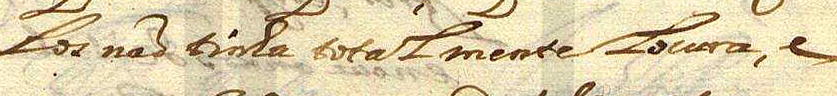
Los naõ tinha totaLmente Locura, e
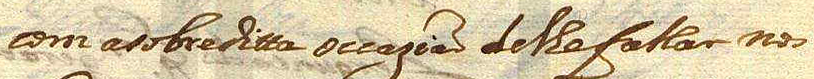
com a sobreditta occaziaõ de lhe fallar nos
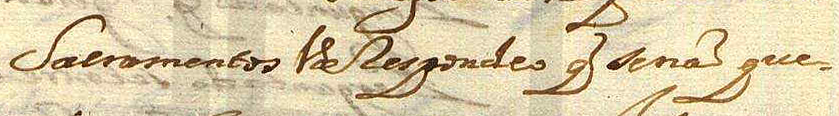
Sacramentos lhe Respondeo q̄ se naõ que
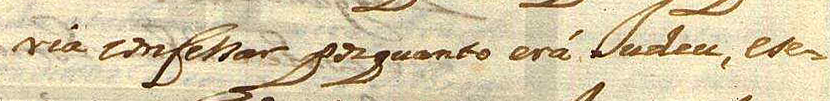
ria confessar porquanto erá Iudeu, e se
